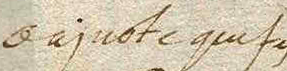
o ajuste que fes
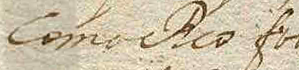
Com o Reo foi
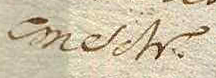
em setr.o
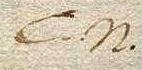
C.n.
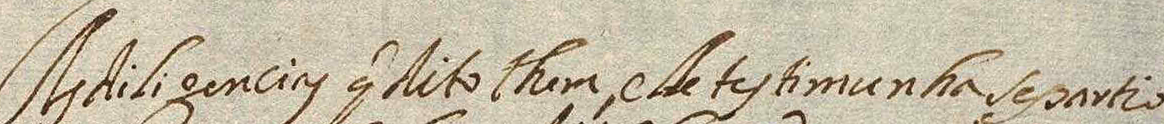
As diligencias q̄ dito them, elle testimunha se partio
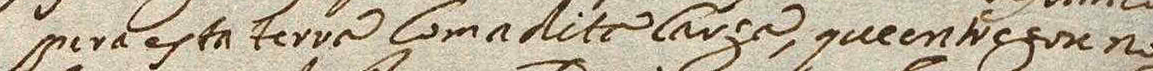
pera esta terra Com a dita Carga, que entregou no
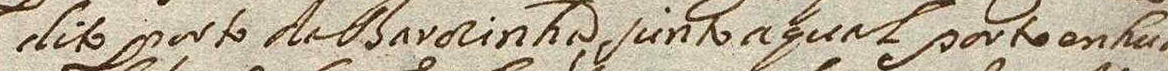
dito porto da Barozinha, junto a qual porto en hua
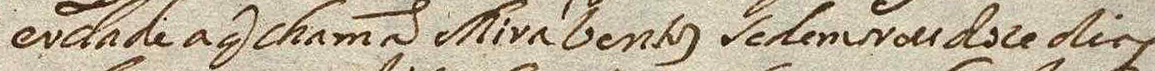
erdade a q̄ chamã Miraventos se demorou doze dias
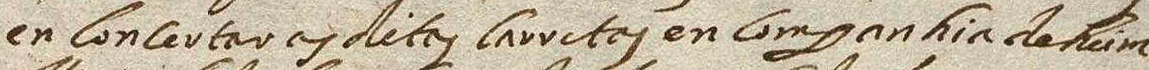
en Concertar as ditas Carretas en Companhia de hum
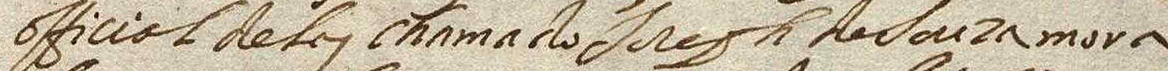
official delas chamado Jozeph de Souza mora
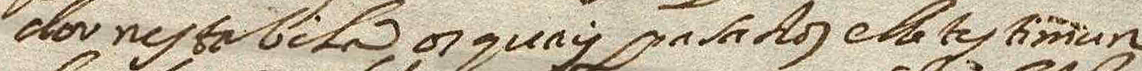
dor nesta Vila, os quais pasados elle testimun
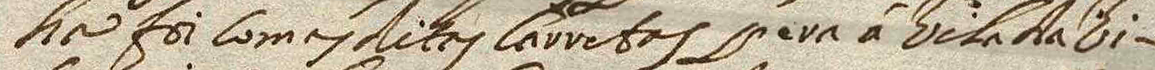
ha foi Com as ditas Carretas pera á Vila da Vi
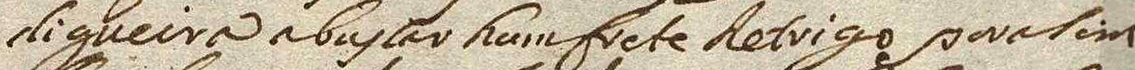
digueira a buscar hum frete de trigo por asim
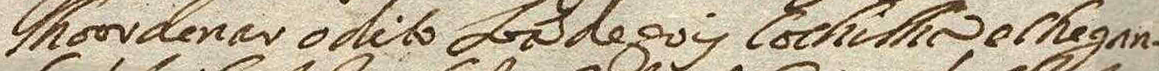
lho ordenar o dito Joã de gois Cochilha, e chegan
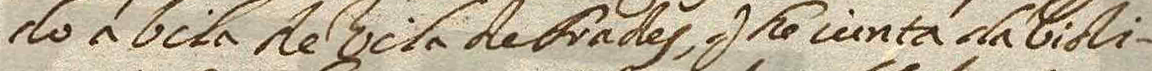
do á Vila de Vila de Frades, q̄ he iunta da Vidi
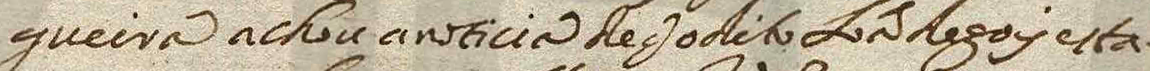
gueira achou a noticia de q̄ o dito Joã de gois esta
